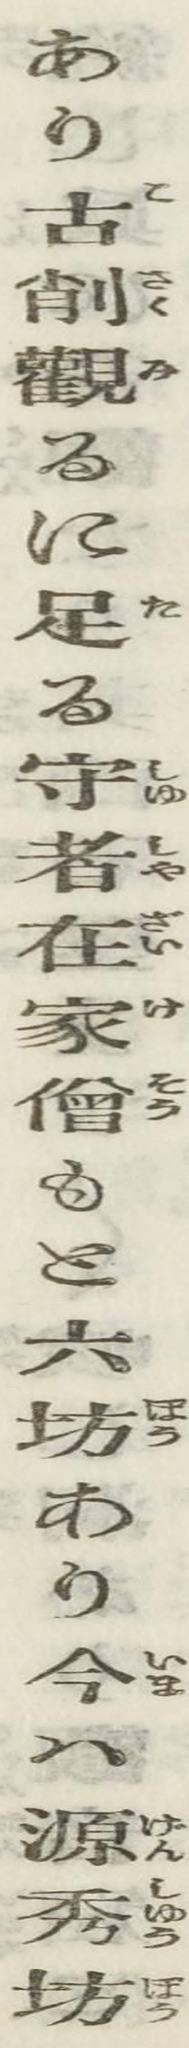あり古削観るに足る守者在家僧もと六坊あり今は源秀坊
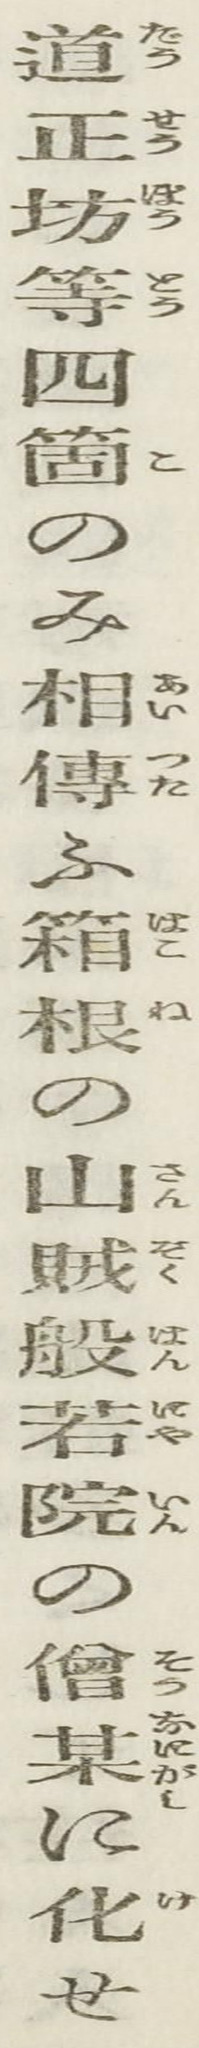道正坊等四箇のみ相伝ふ箱根の山賊般若院の僧某に化せ
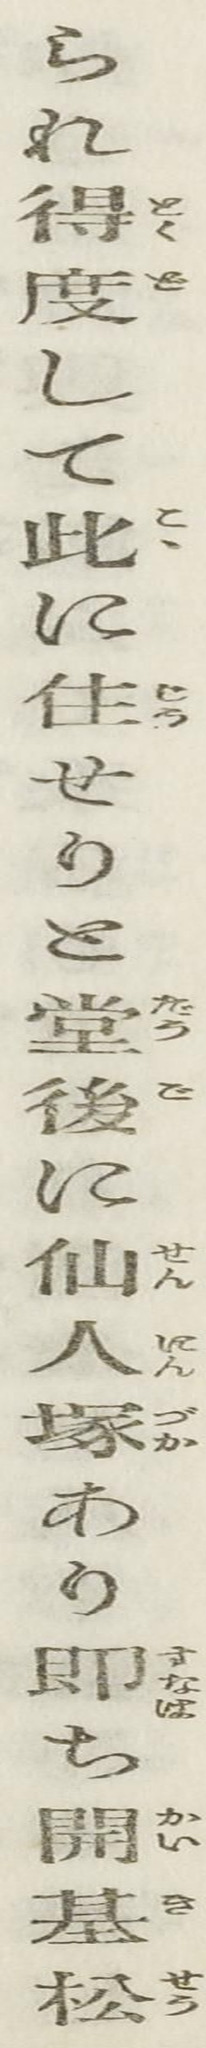られ得度して此に住せりと堂後に仙人塚あり即ち開基松
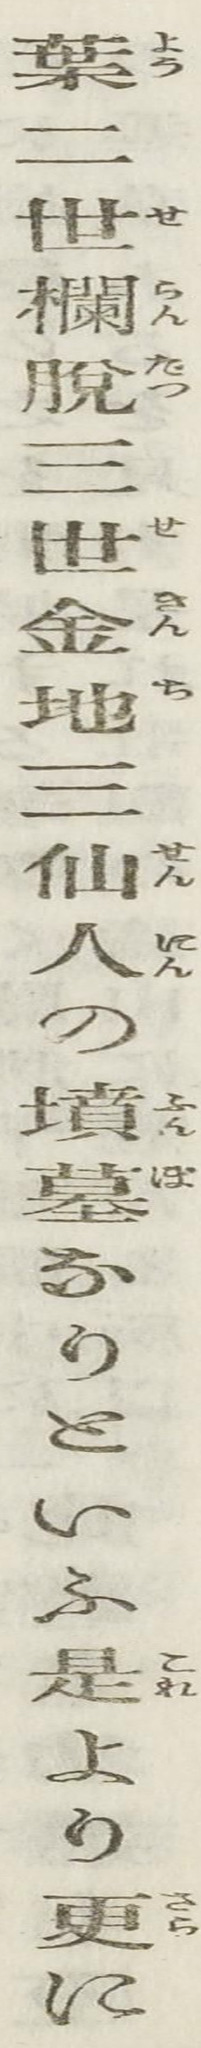葉二世爛脱三世金地三仙人の墳墓なりといふ是より更に
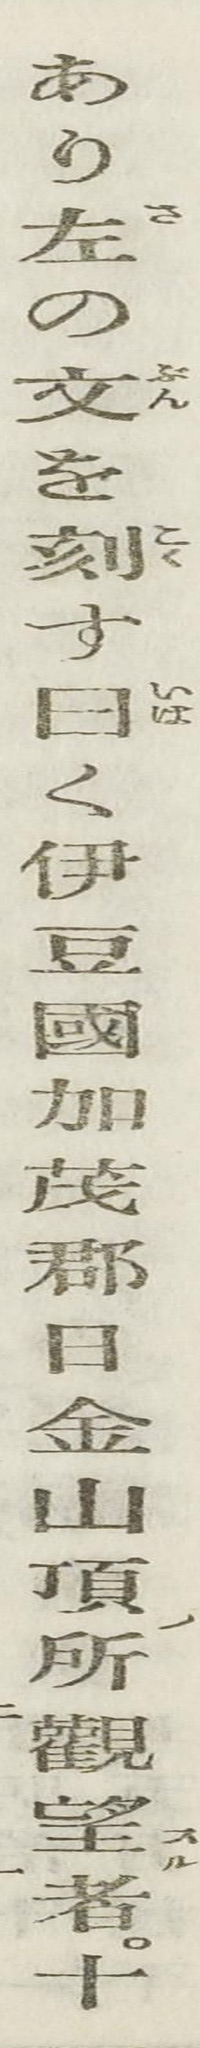あり左の文を刻す曰く伊豆國加茂郡日金山頂所観望者。十
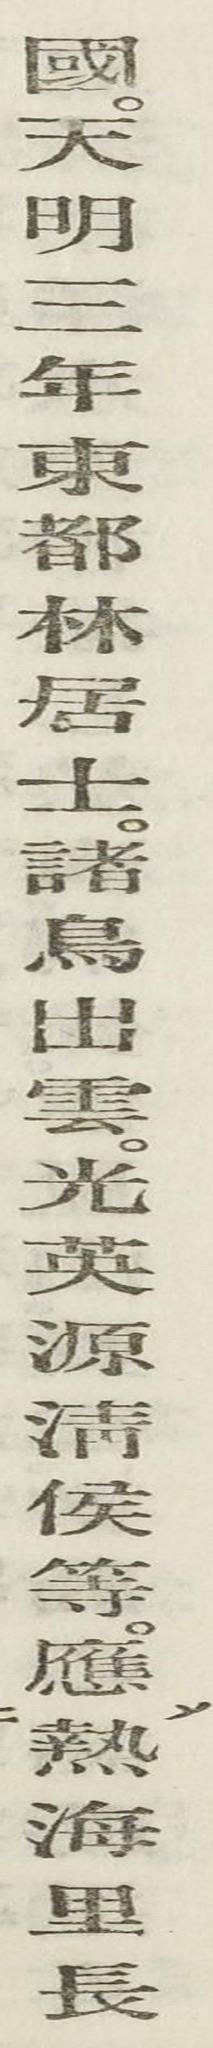國。天明三年東都林居士。諸鳥出雲。光英源清侯等。応熱海里長
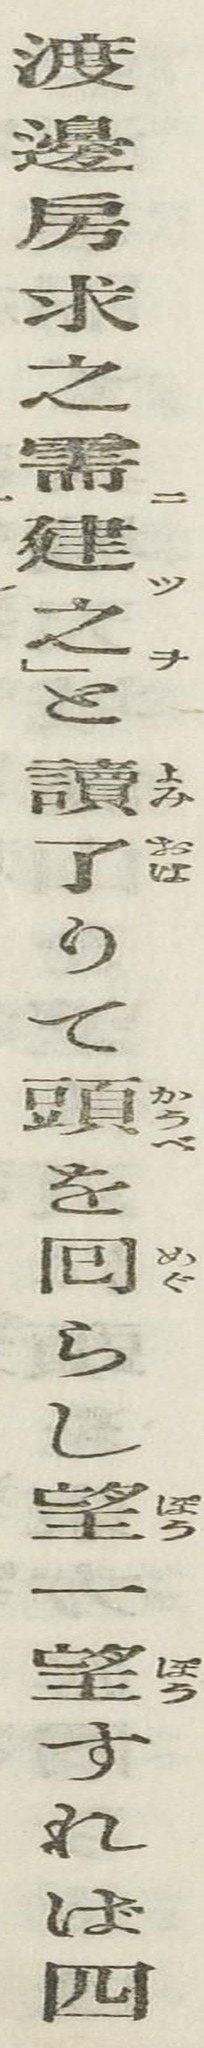渡邊房求之需二建之」と読了りて頭を囘らし望一望すれば四
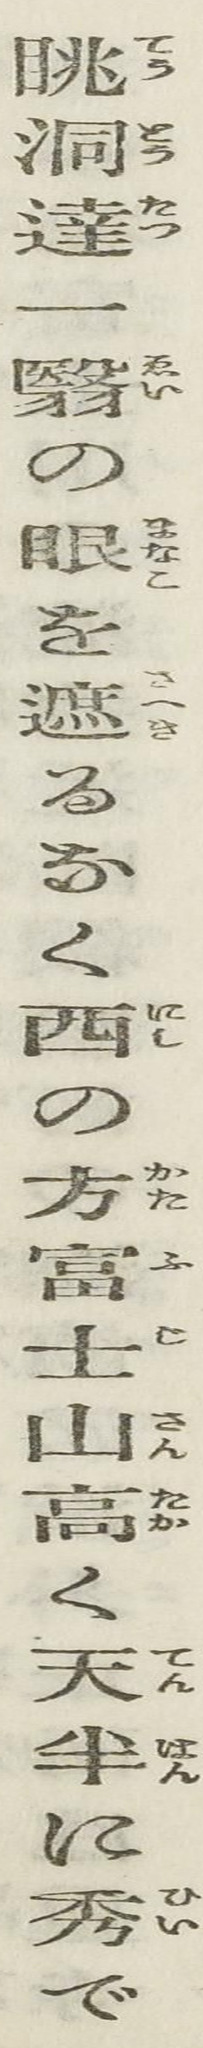眺洞達一翳の眼を遮るなく西の方富士山高く天半に秀で
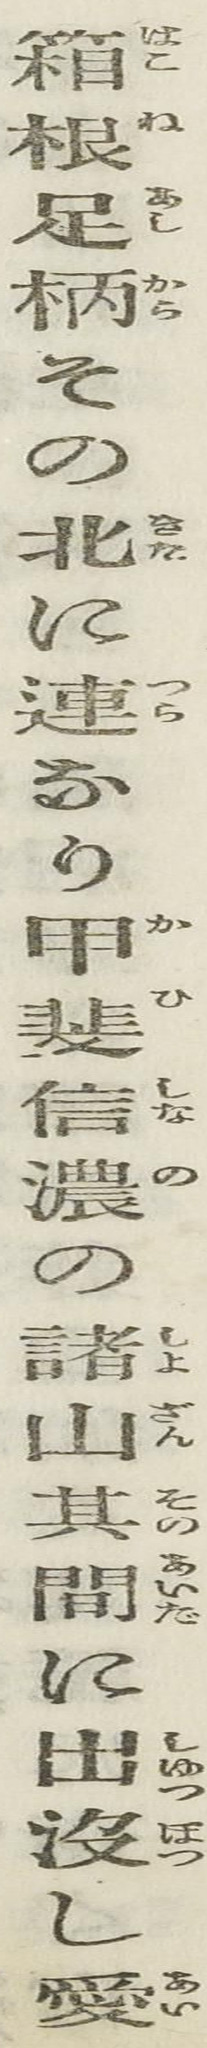箱根足柄その北に連なり甲斐信濃の諸山其間に出没し愛

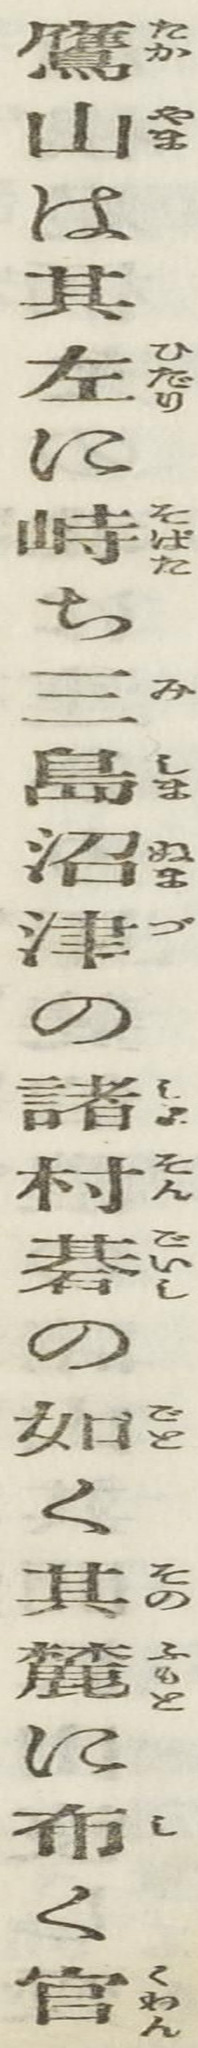鷹山は其左に峙ち三島沼津の諸村碁の如く其麓に布く官
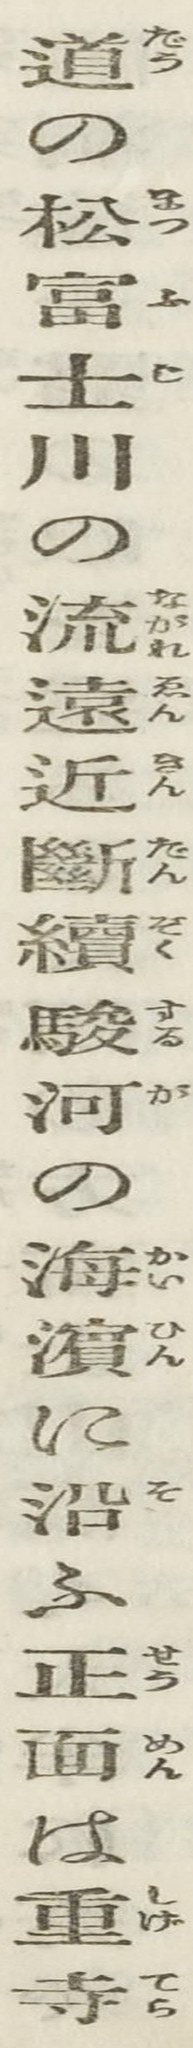道の松富士川の流遠近断読駿河の海浜に沿ふ正面は重寺
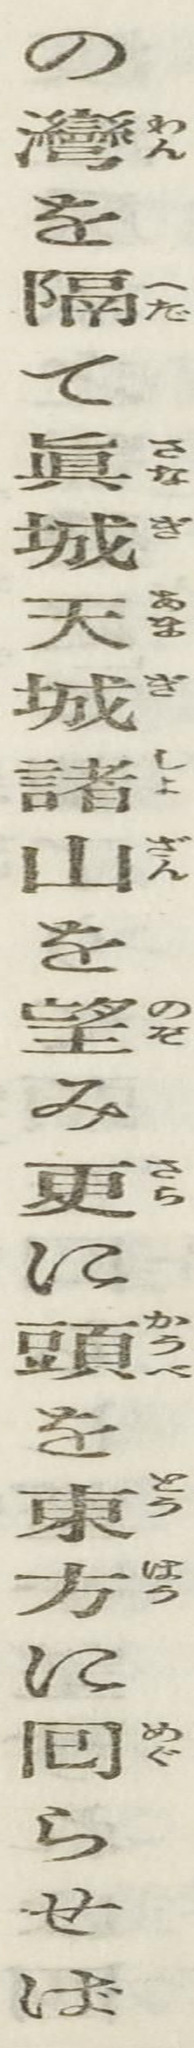の湾を隔て真城天城諸山を望み更に頭を東方に囘らせば
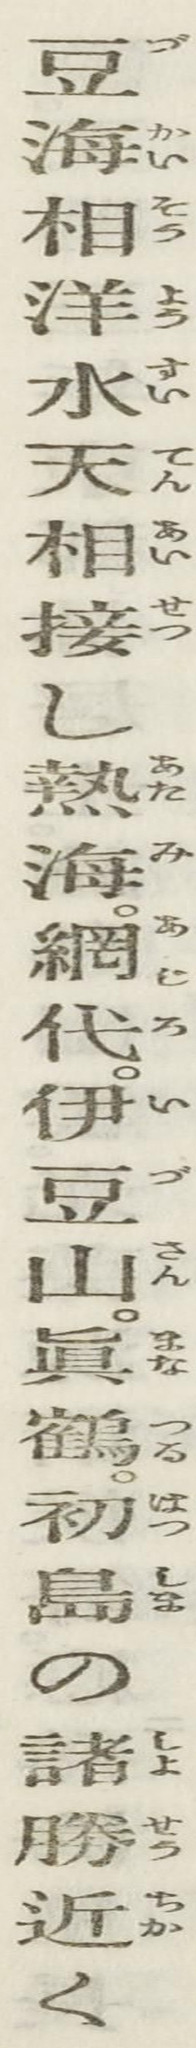豆海相洋水天相接し熱海。網代。伊豆山。真鶴。初島の諸勝近く
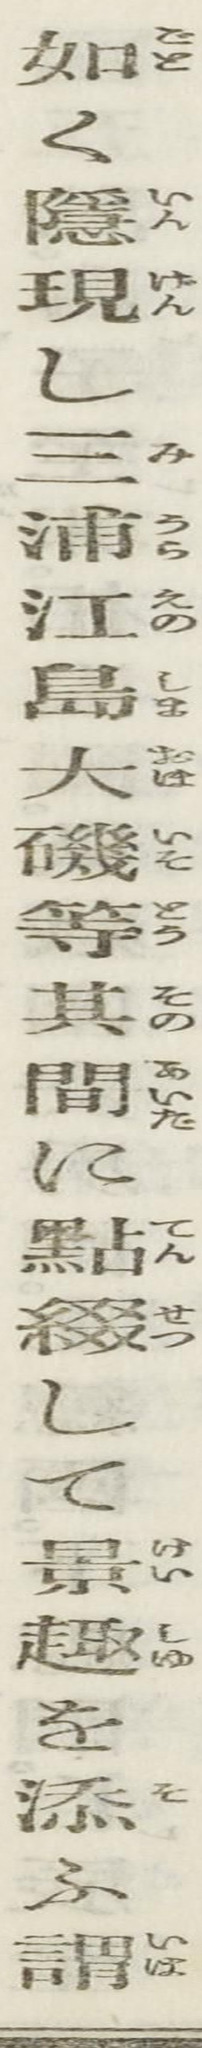如く隠現し三浦江島大磯等其間に點綴して景趣を添ふ謂
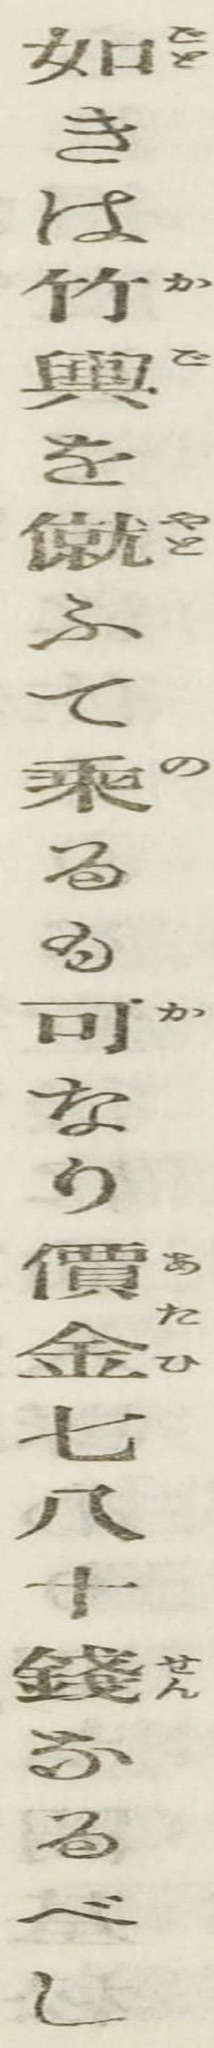如きは竹輿を僦ふて乗るも可なり價金七八十銭なるべし
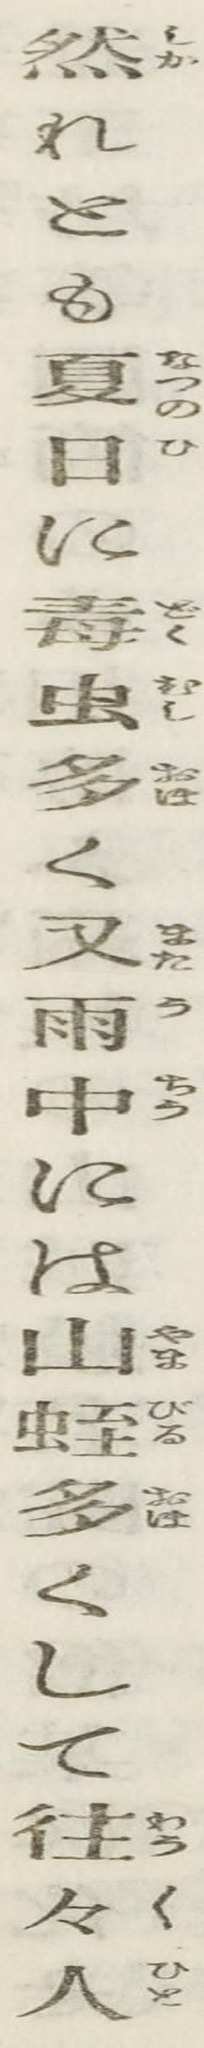然れども夏日に毒虫多く又雨中には山蛭多くして往々人
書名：熱海獨案内　全
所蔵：東京大学地震研究所図書室 Earthquake Research Institute Library, The University of Tokyo, JAPAN
